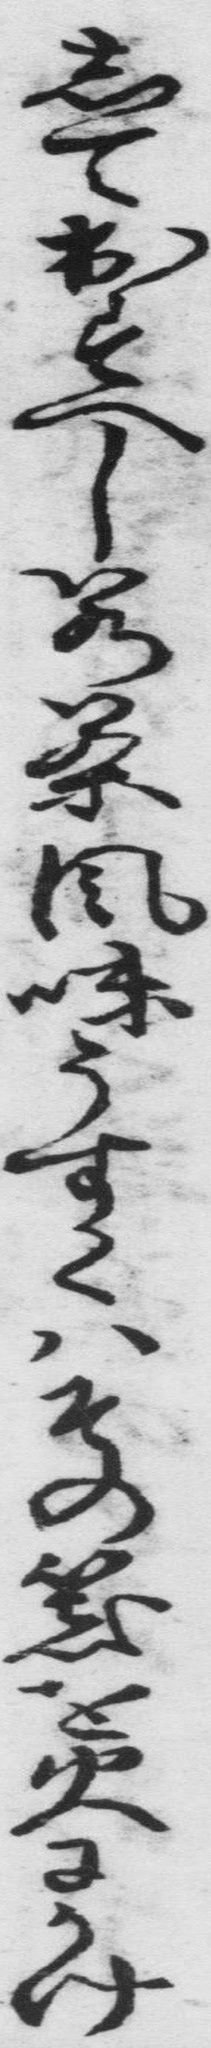志て出春へし前茶風味うすくはその器を火尓かけ
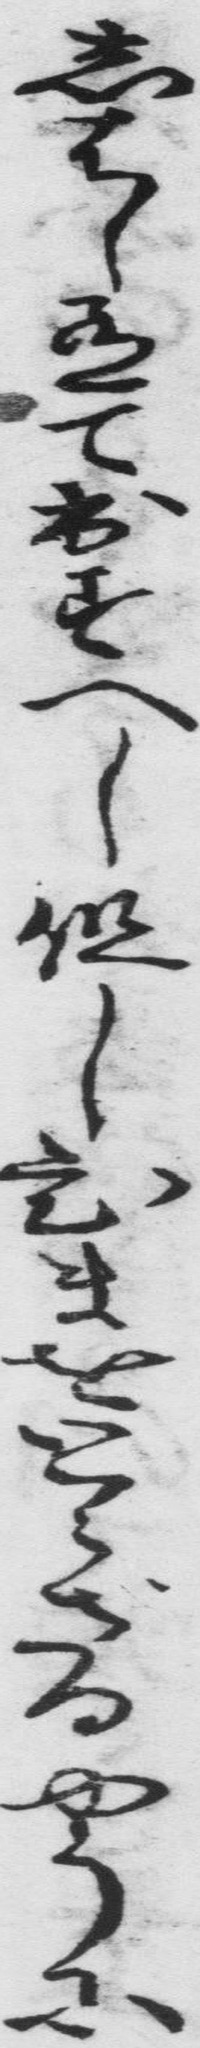志はし有て出春へし但し飛まをとらさるやう尓
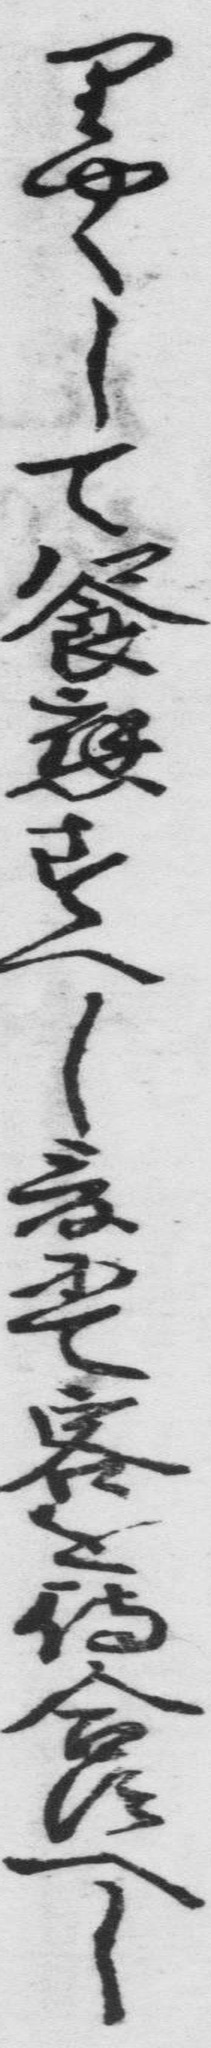里やくして饗應春へし爰尓て客を待合須へし
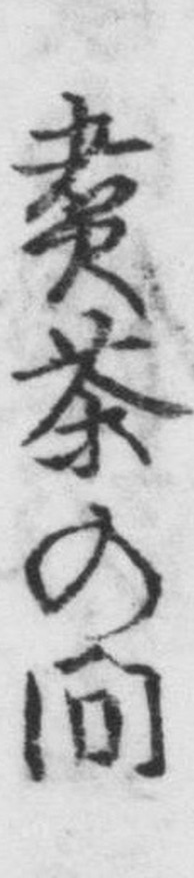煮茶の間
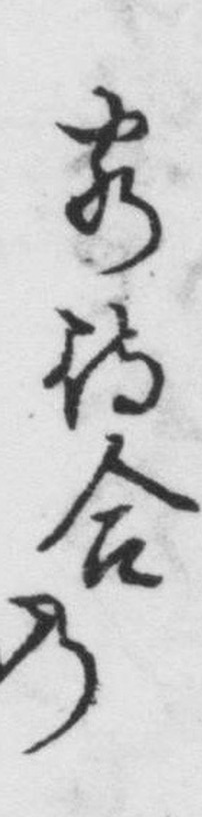客待合乃
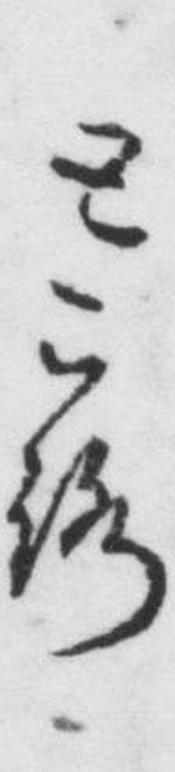とこ路

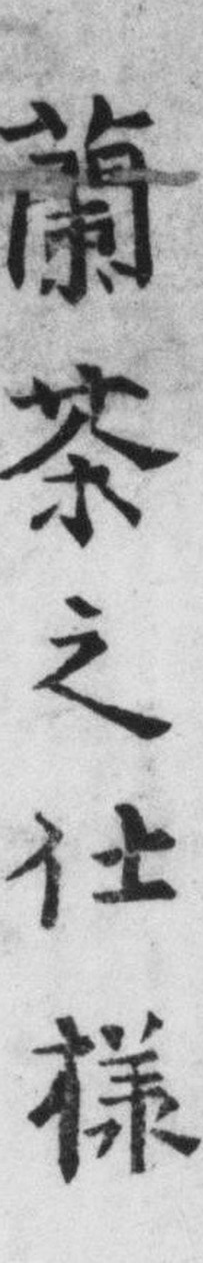蘭茶之仕様
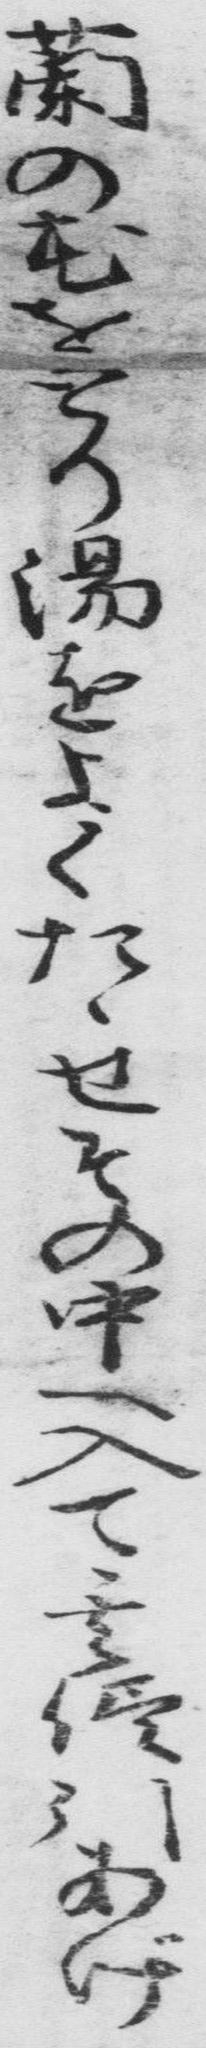蘭の花をとり湯をよくたゝせその中へ入て其侭引あげ
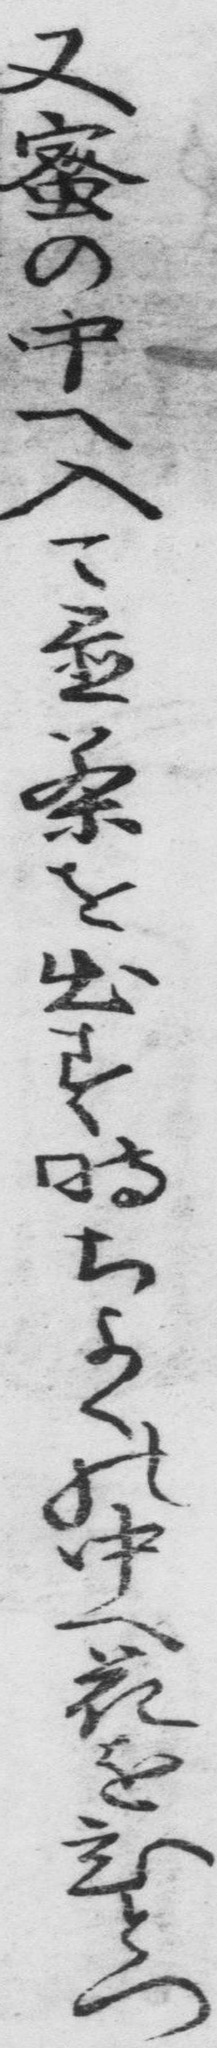又蜜の中へ入て置茶を出春時ちよく能中へ花を飛とつ
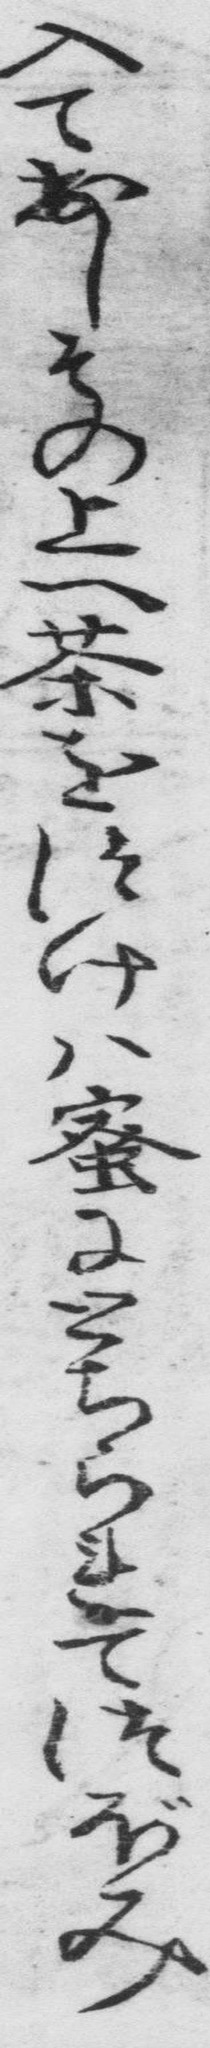入て出しその上へ茶を徒けは蜜尓とちら連て徒ぼみ
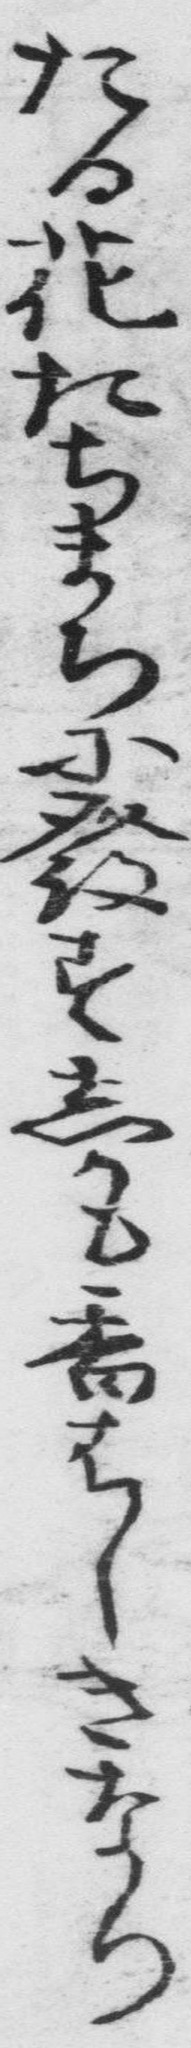たる花たちまち尓発春志かも香はしきなり
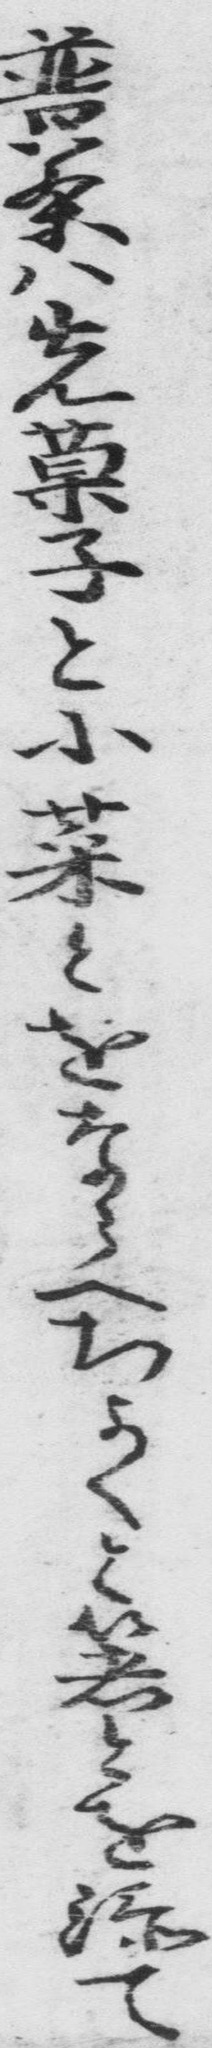普茶は先菓子と小菜とをならへちよくと箸とを添て
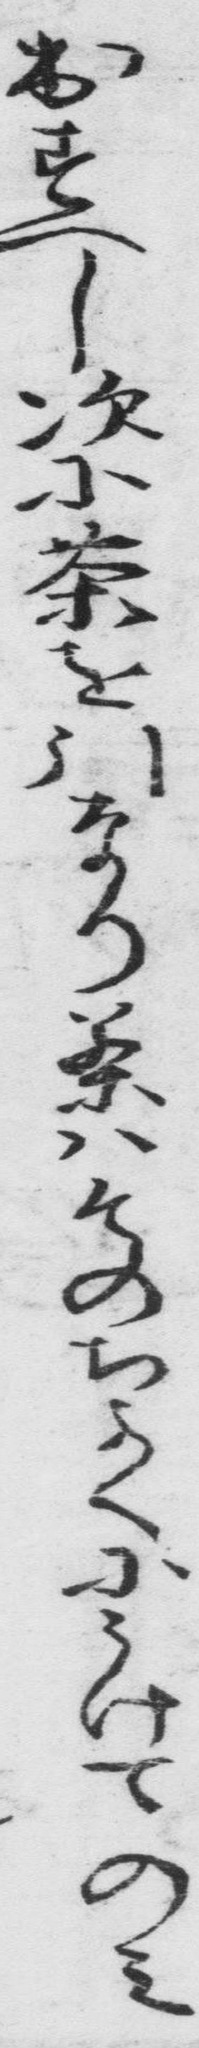出春へし次尓茶を引なり茶はそのちよく尓うけてのみ
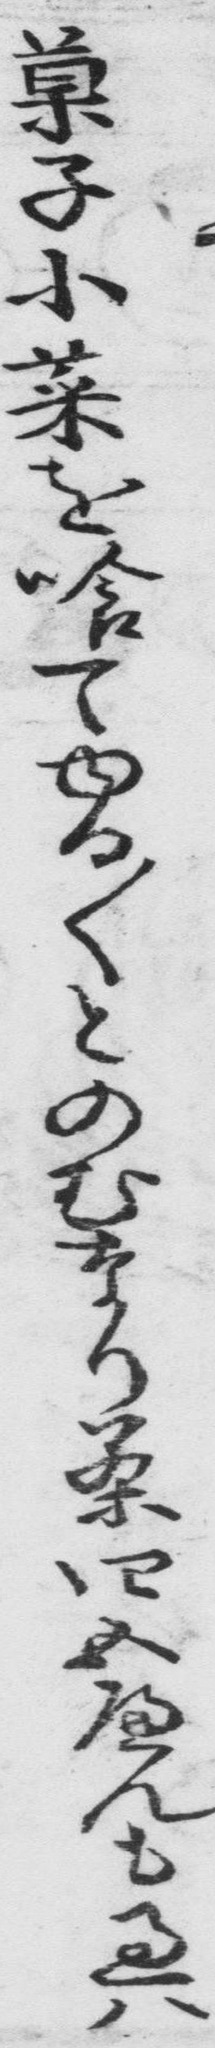菓子小菜を喰てゆる〳〵とのむなり茶四五扁んも過は
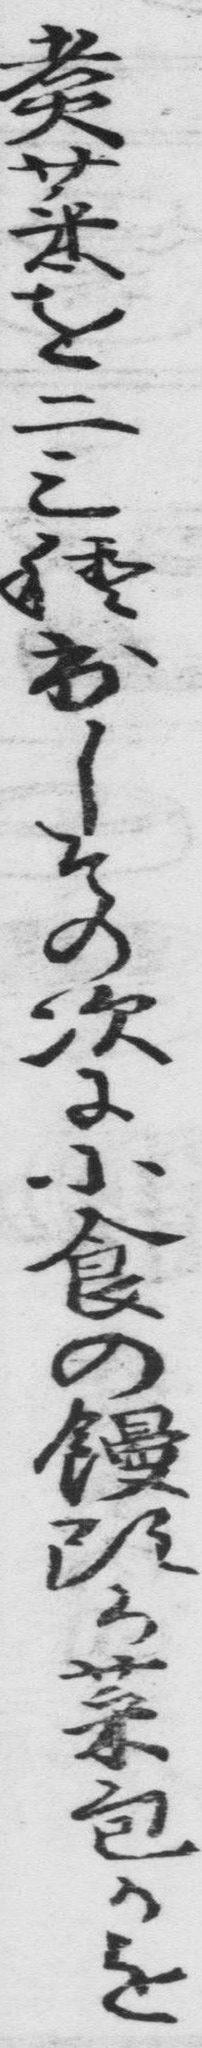煮菜を二三種出しその次尓小食の饅頭か菜包かを
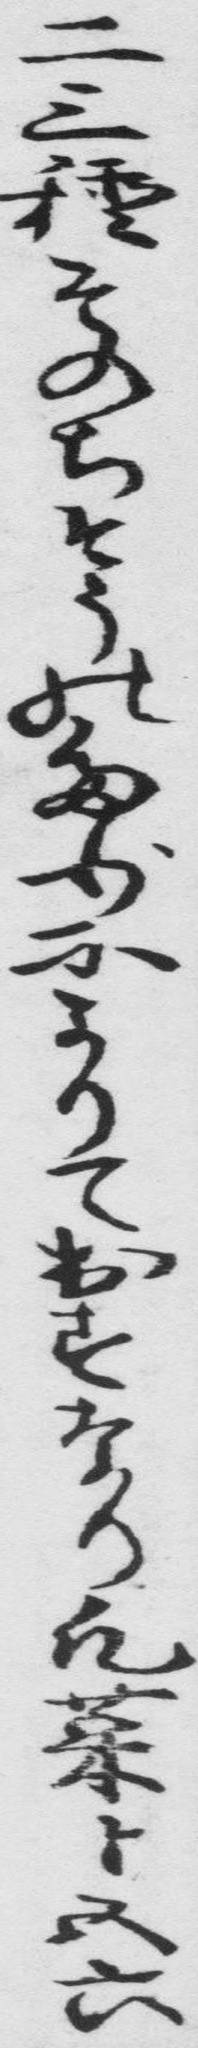二三種そのちそう能多少尓よりて出春なり凡菜と五六
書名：普茶料理抄
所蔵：大阪府立大学学術情報センター 国文学研究資料館
